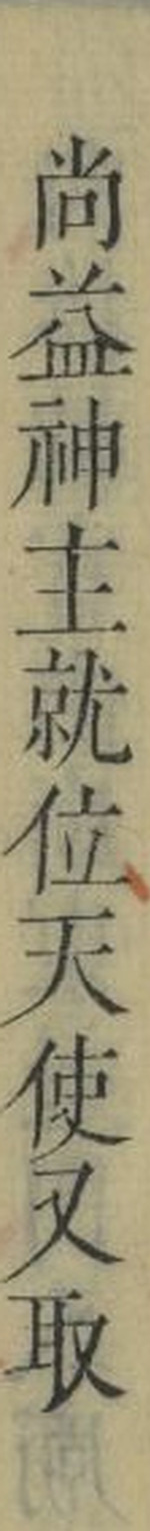尚益神主就位天使又取
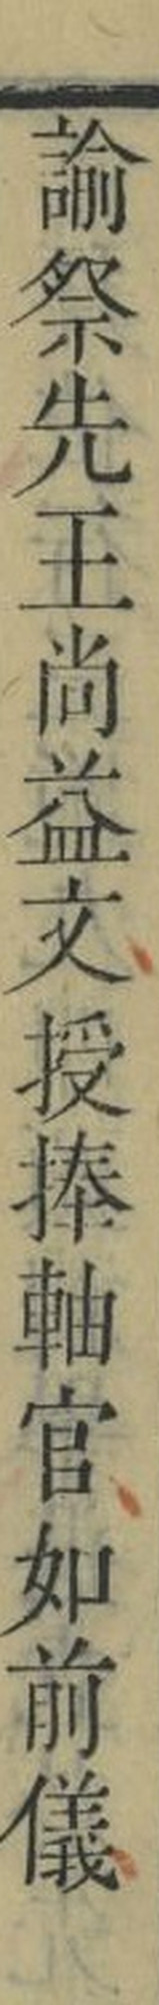諭祭先王尚益文授捧軸官如前儀
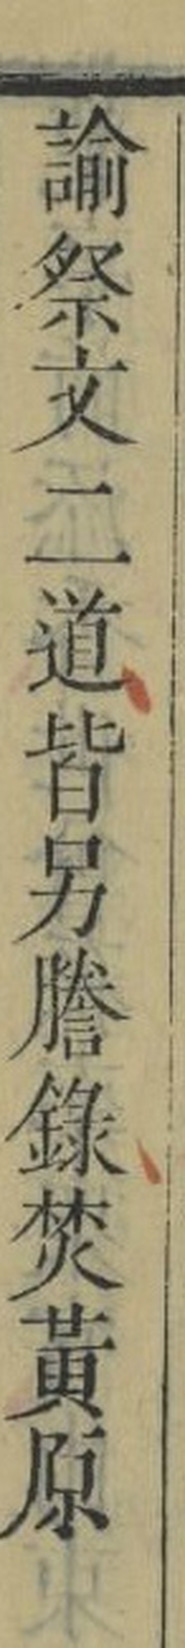諭祭文二道皆另謄錄焚黃原
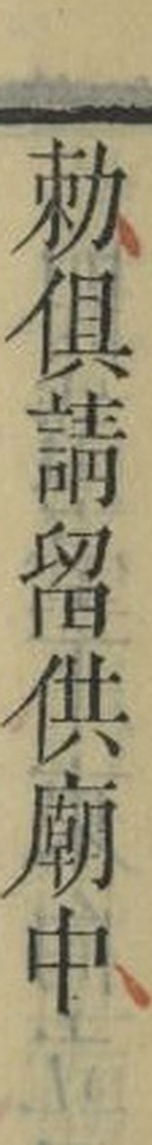勅俱請留供廟中
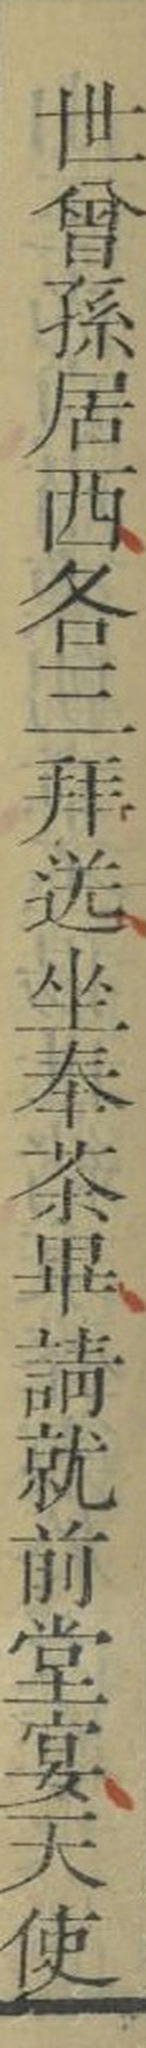世曾孫居西各三拜送坐奉茶畢請就前堂宴天使
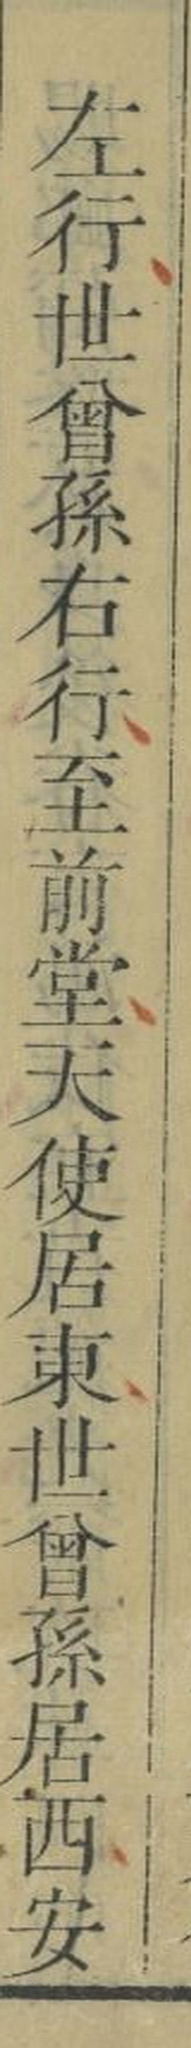左行世曾孫右行至前堂天使居東世曾孫居西安
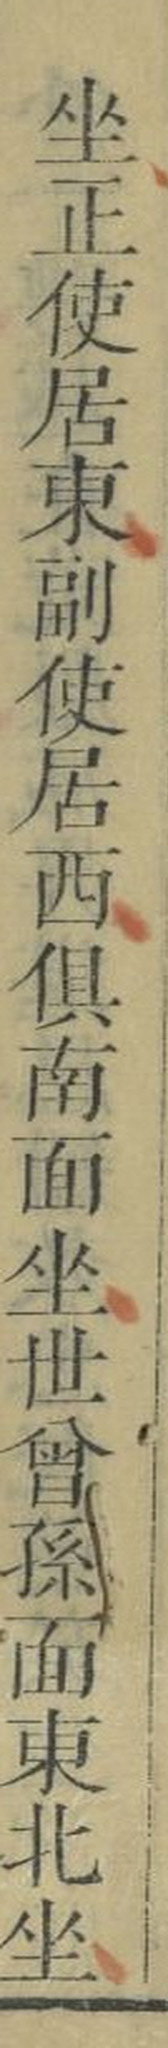坐正使居東副使居西俱南面坐世曾孫面東北坐
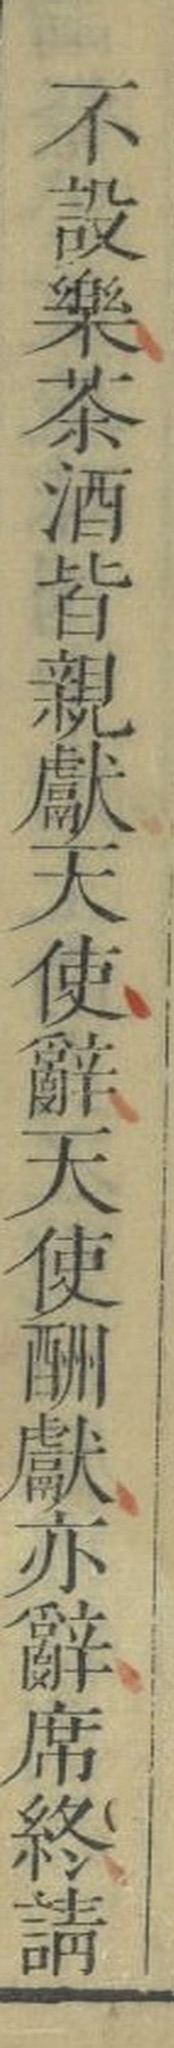不設樂茶酒皆親獻天使辭天使酬獻亦辭席終請
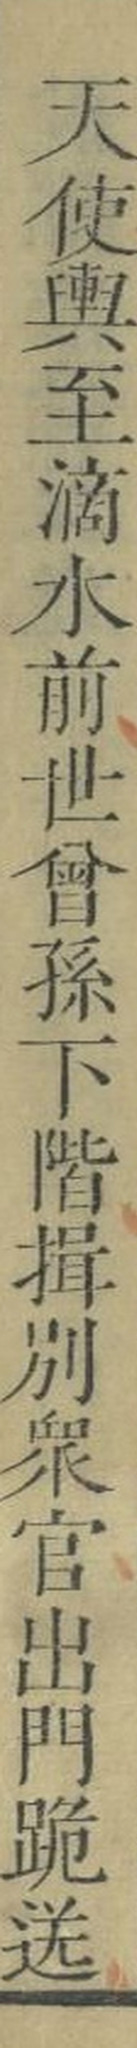天使輿至滴水前世曾孫下階揖別衆官出門跪送
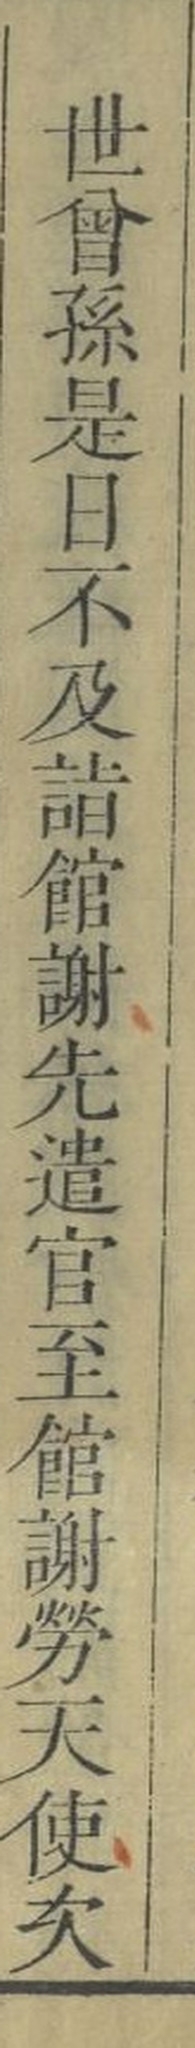世曾孫是日不及詣館謝先遣官至館謝勞天使次
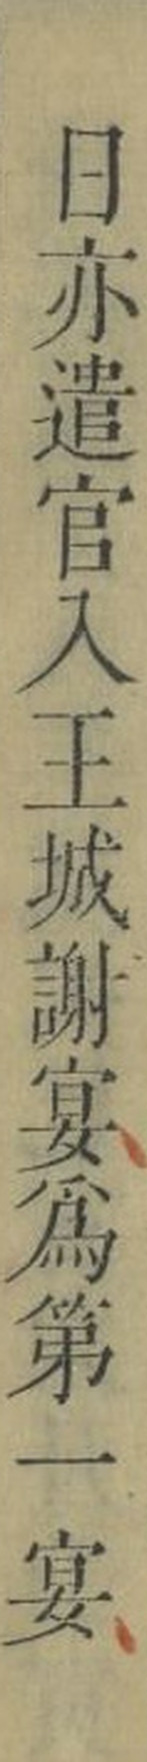日亦遣官入王城謝宴爲第一宴

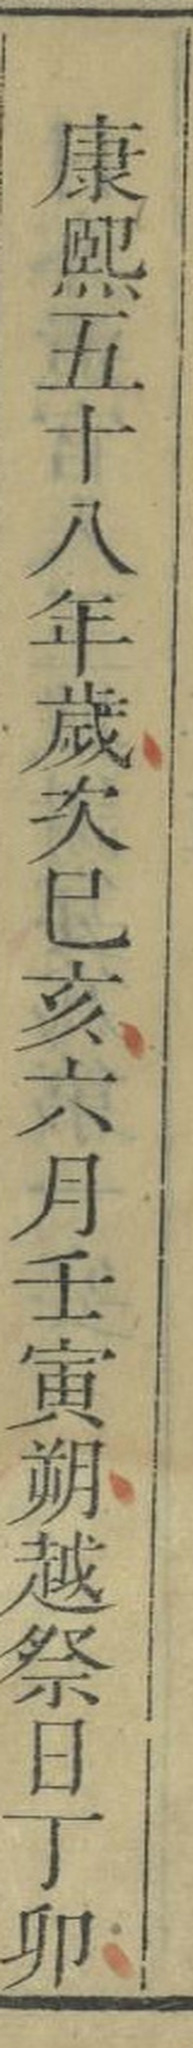康煕五十八年歲次巳亥六月壬寅朔越祭日丁卯
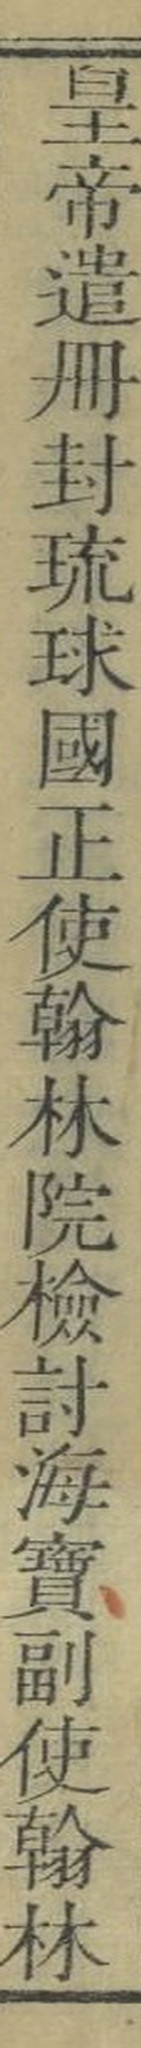皇帝遣冊封琉球國正使翰林院檢討海寶副使翰林
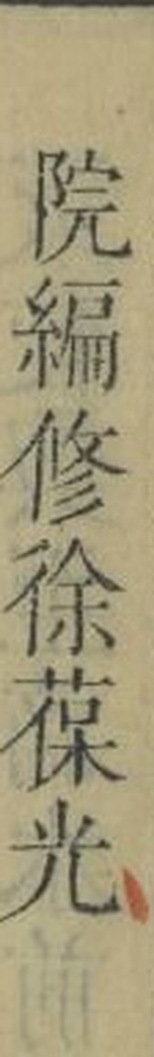院編修徐葆光
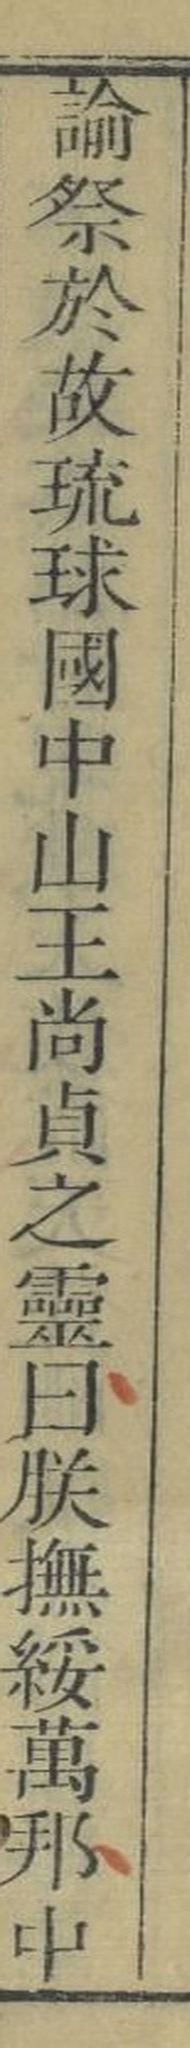諭祭於故琉球國中山王尚貞之靈曰朕撫綏萬邦中
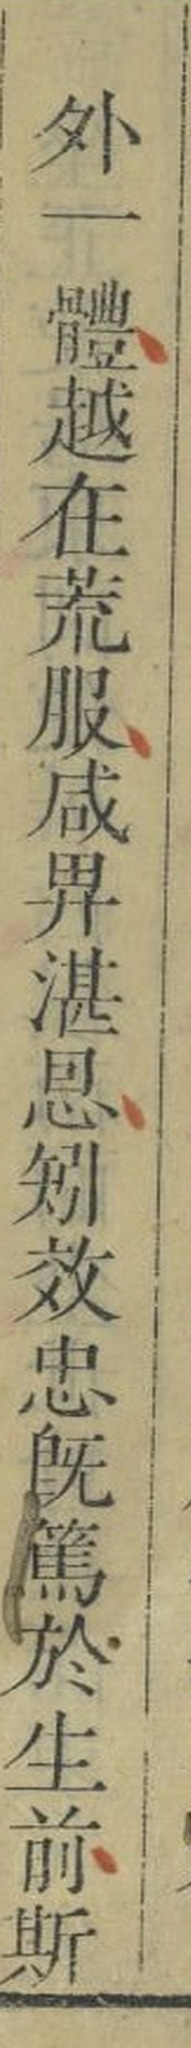外一體越在荒服咸畀湛㤙矧效忠既篤於生前斯
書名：中山伝信録 巻一、巻二
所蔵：University of the Ryukyus Library
